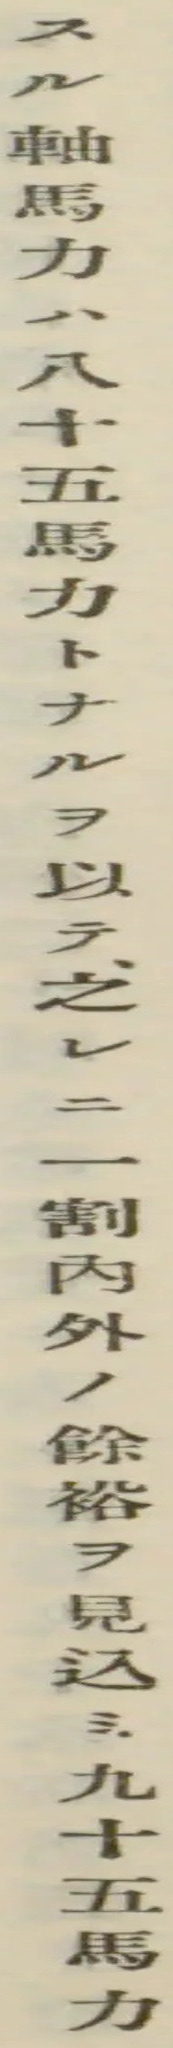する軸馬力は八十五馬力となるを以て、之れに一割内外の余裕を見込み九十五馬力
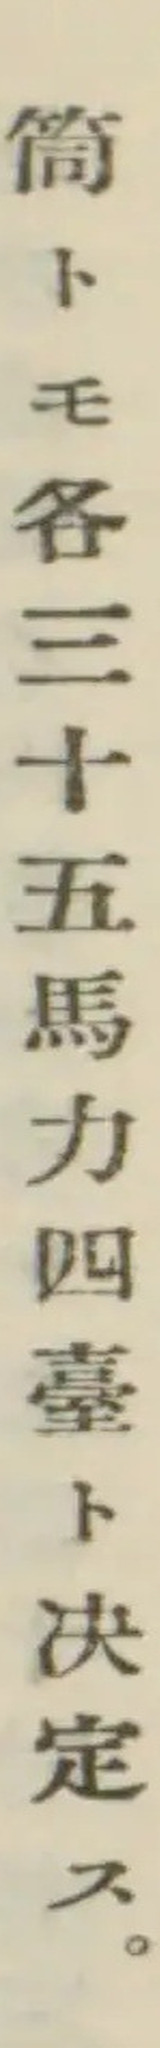筒とも各三十五馬力四臺と決定す。
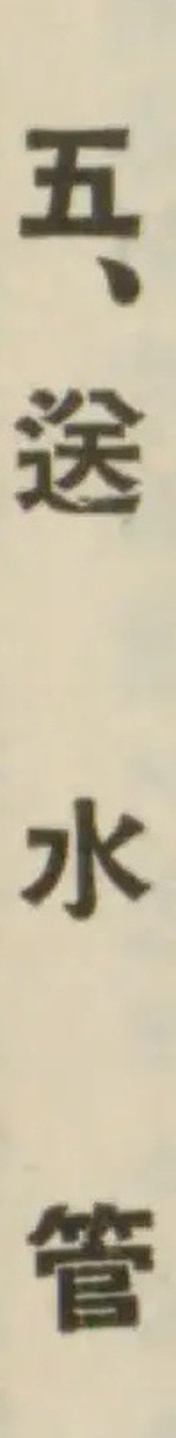五、送水管
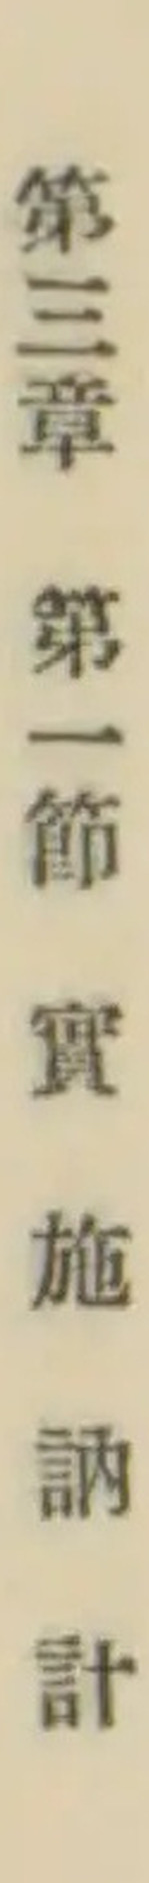第三章第一節実施設計

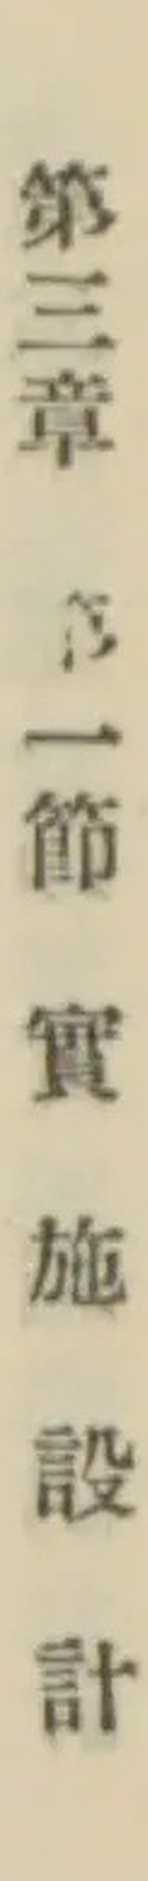第三章第一節実施設計
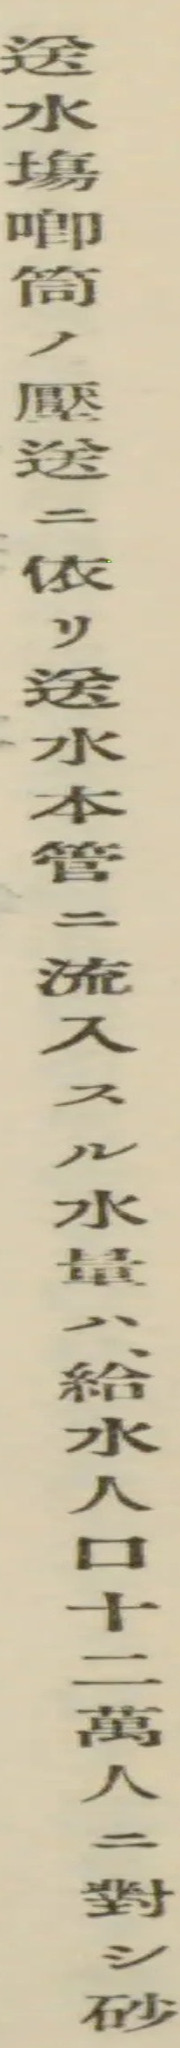送水場喞筒の壓送に依り送水本管に流入する水量は、給水人口十二萬人に対し砂
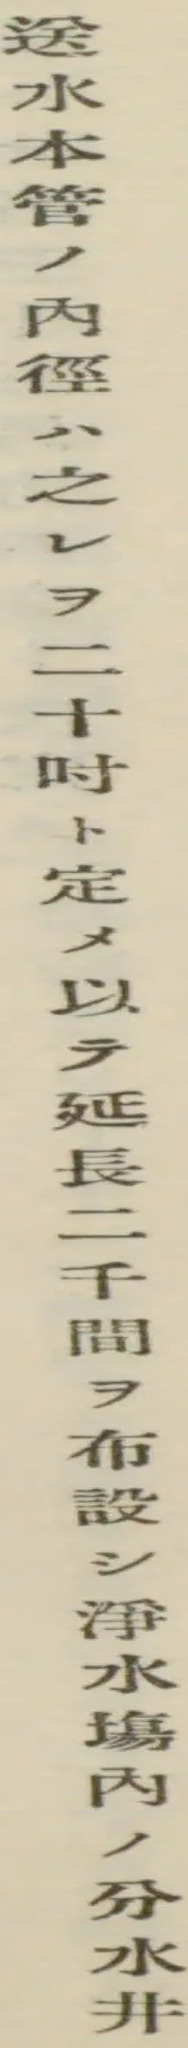送水本管に内径は之れを二十吋と定め以て延長二千間を布設し浄水場内の分水井
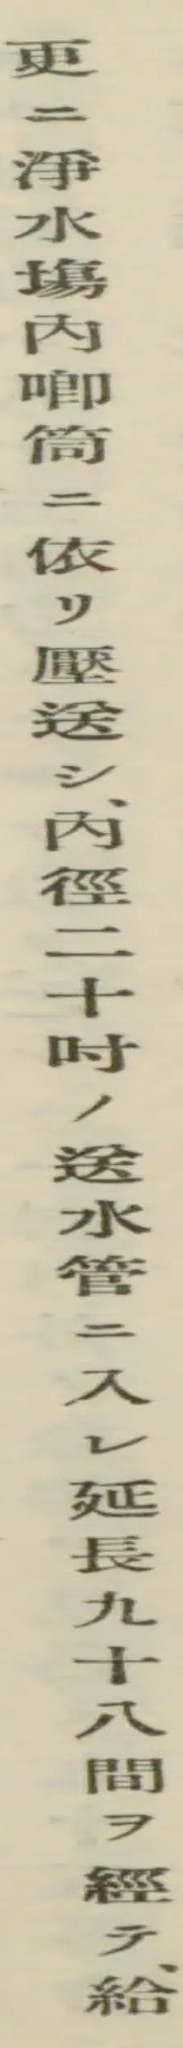更に浄水場内喞筒に依り壓送し、内径二十吋の送水管に入れ延長九十八間を経て、給
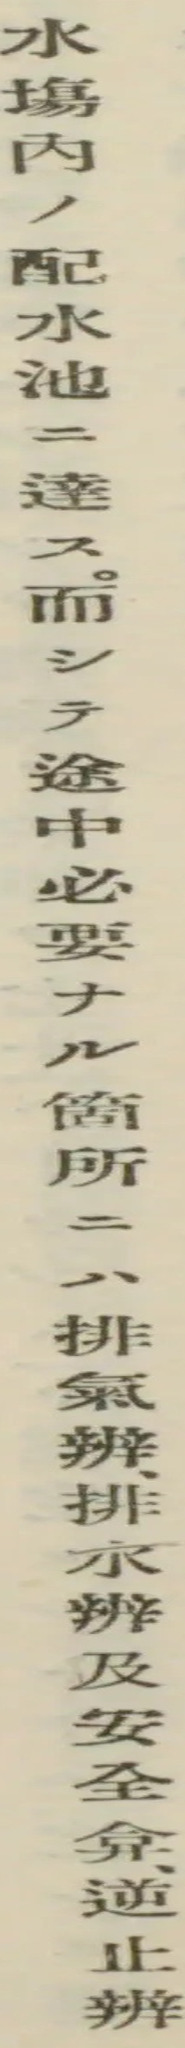水場内の配水池に達す。而して途中必要なる箇所には排気辨、排水辨及安全弇、逆止辨
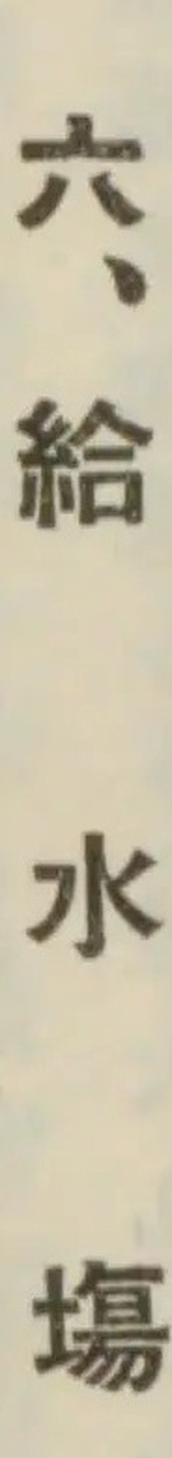六、給水場
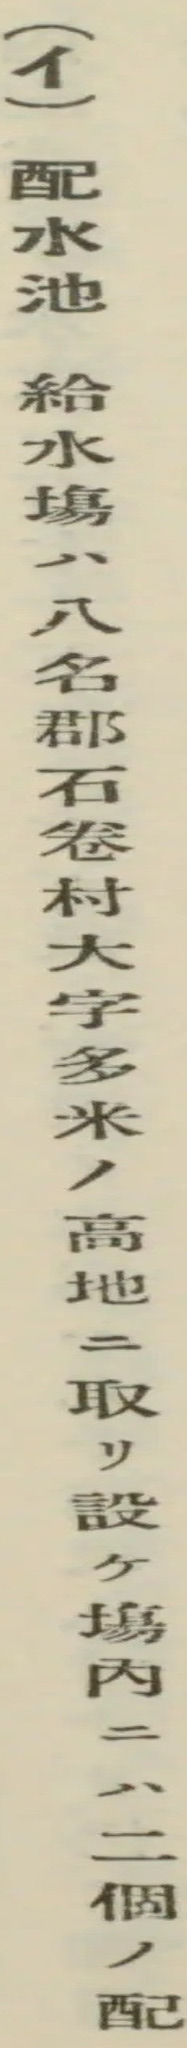(イ)配水池給水場は八名郡石巻村大字多米の高地に取り設け場内にには二個の配
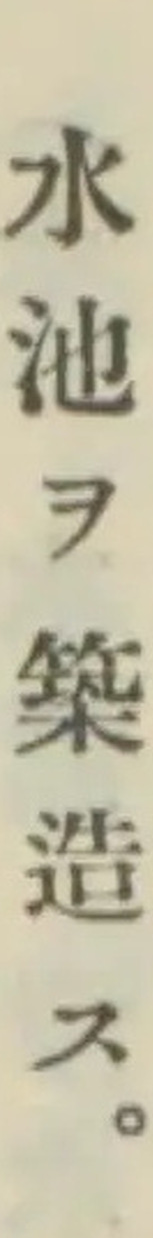水池を築造す。
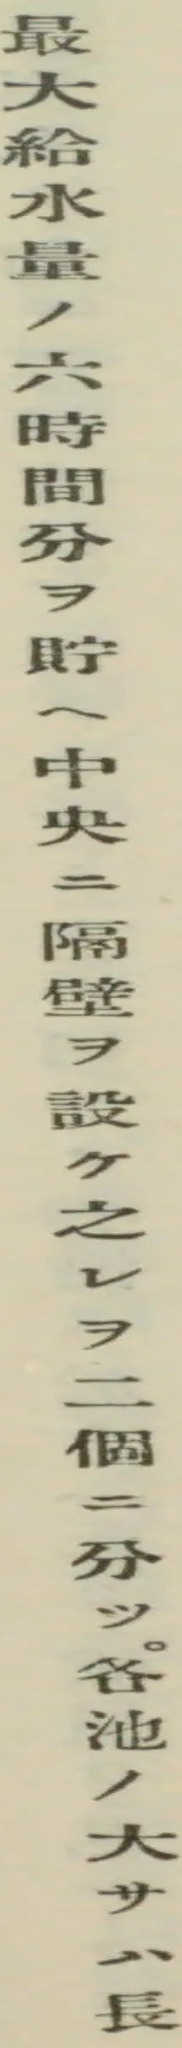最大給水量の六時間分を貯へ中央に隔壁を設け之れを二個に分つ。各池の大さは長
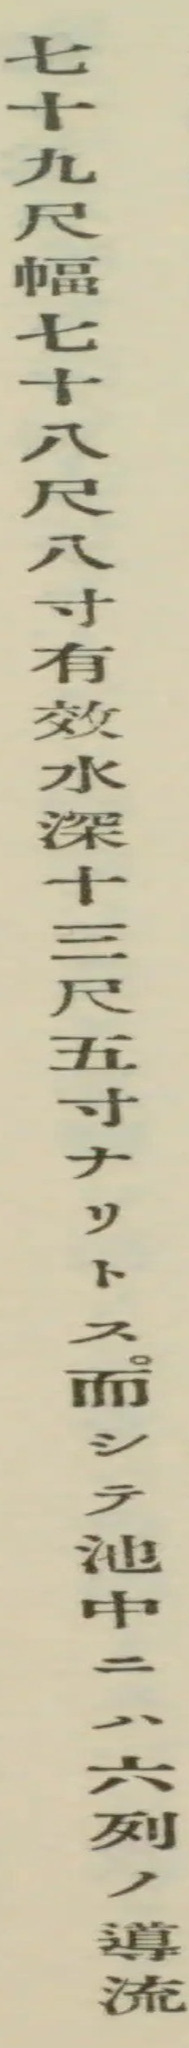七十九尺幅七十八尺八寸有効水深十三尺五寸なりとす。而して池中には六列の導流
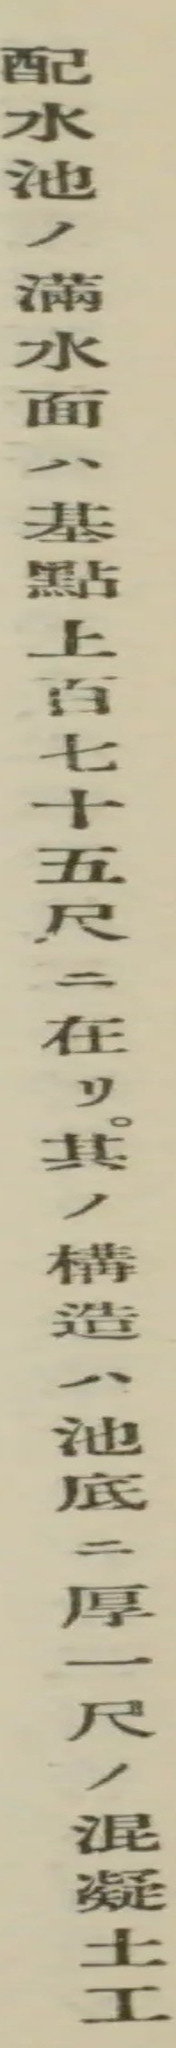配水池の満水面は基點上百七十五尺に在り。其の構造は池底に厚一尺の混凝土工
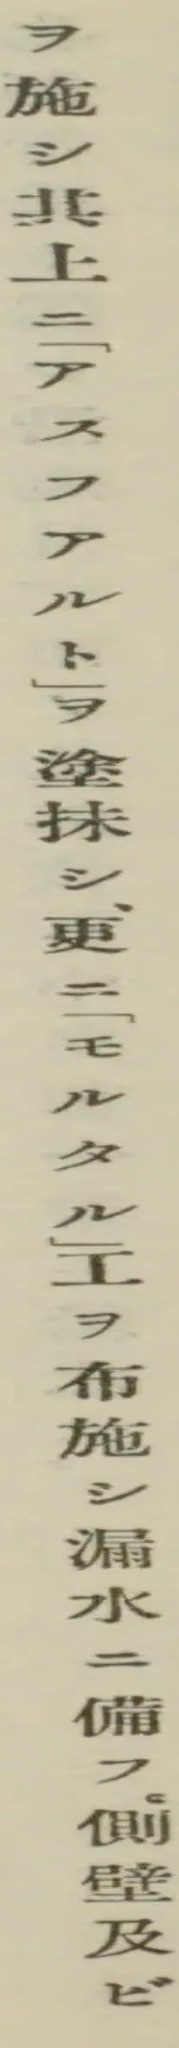を施し其上に「アスファルト」を塗沫し、更に「モルタル」工を布施し漏水に備ふ、側壁及び
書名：豊橋市水道誌
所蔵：国立国会図書館 National Diet Library, JAPAN
